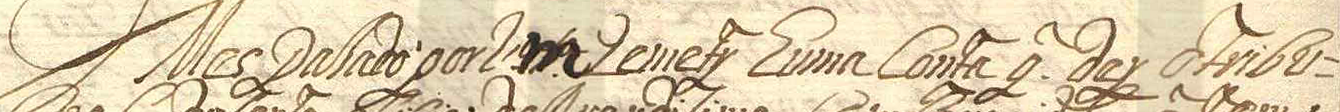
Mes Passado por Vm remety huma Conta q̄ dey o Tribi
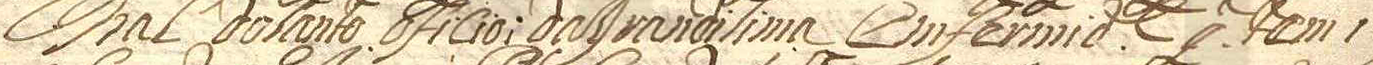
nal do santo oficio; da Grandisima Emfermid.e q̄ tem,
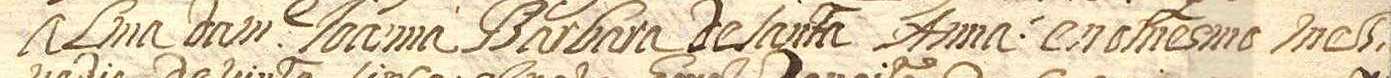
aLma da m.e Ioanna Barbara de santa Anna: e no mesmo mes
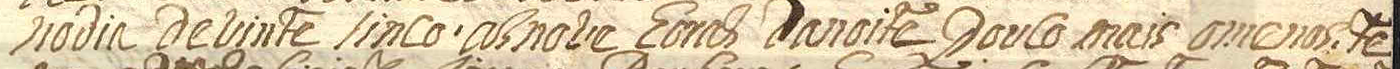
no dia de vinte sinco as nove horas da noite pouco mais o menos. te
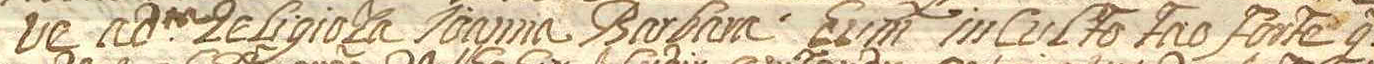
ve a d.a Religioza Ioanna Barbara hum inculto taõ forte q̄
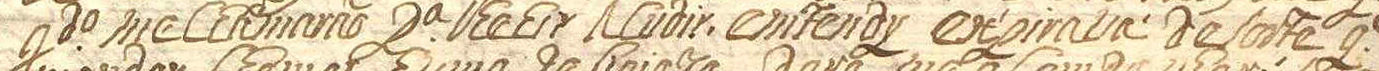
q.do me Chamarão p.a lhe hir acudir emtendy expirava de sorte q̄
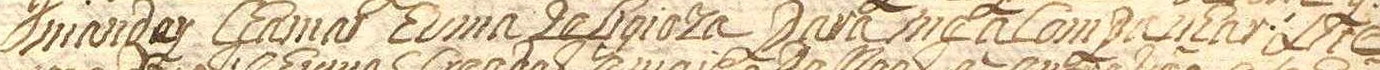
mandey Chamar huma Religioza para me acompanhar vie
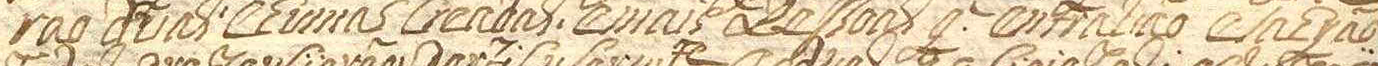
raõ duas e humas creadas. E mais pessoas q̄ entraRaõ e sahyaõ
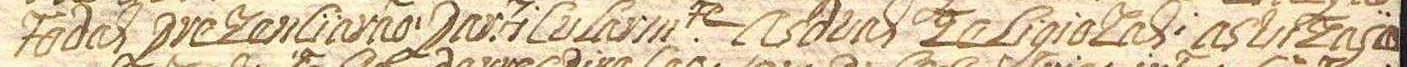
todas prezenCiaraõ particularm.te as duas religiozas as uizase
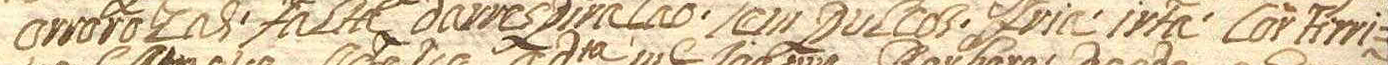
orrorozas falta da rrespiraçaõ; sem pulços. fria irta cor tirri
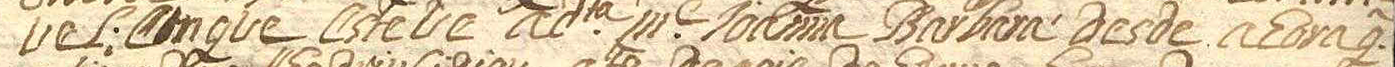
vel: em que esteve a d.ta m.e Ioanna Barbara desde a hora q̄
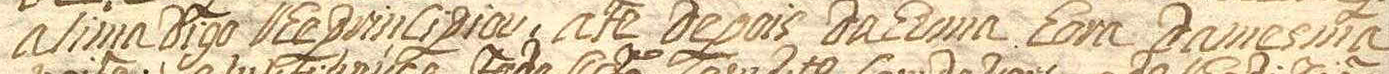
asima digo lhe principiou, ate depois da huma hora da mesma
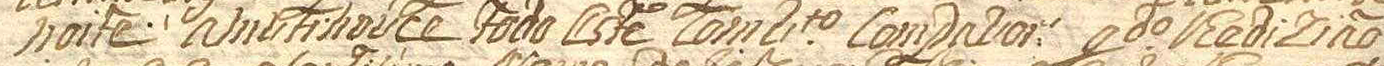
noite. amutinouce todo este Comv.to com pavor: qdo lhe diziaõ
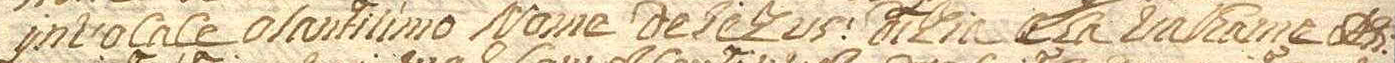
ynvocace o santisimo nome de Iezus: dizia ela valhame Ds.
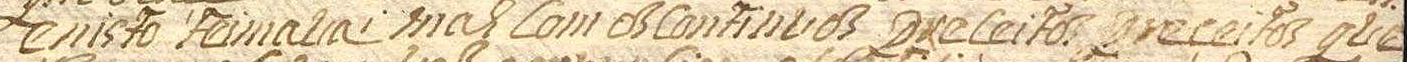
e nisto teimaua: mas com os continuos preceitos preceitos que
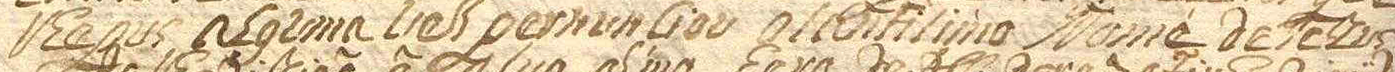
lhe pus alguma ves pernunciou o Iustisimo Nome de Iezus
